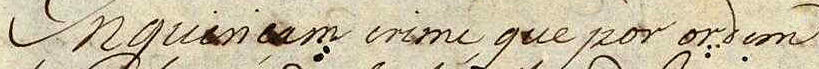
Inquisiçam crime que por ordem
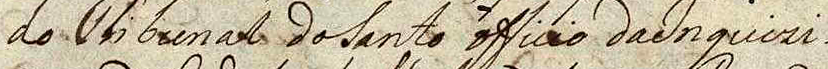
do Tribunal do Santo officio da Inquizi
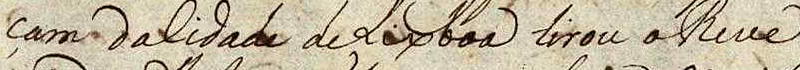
çam da Cidade de Lixboa tirou o Reve
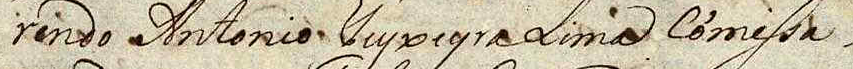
rendo Antonio Teyxeyra Lima Cōmissa
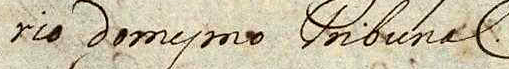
rio do mesmo Tribunal.
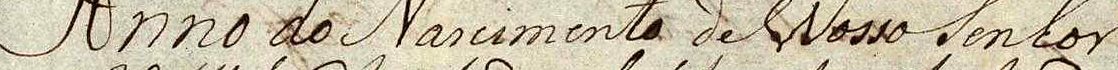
Anno do Nascimento de Nosso Senhor
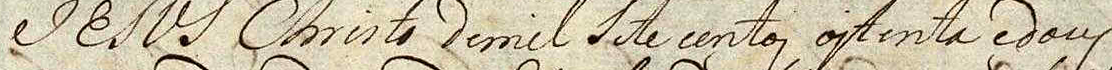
JESUS Christo de mil Setecentos oitenta e dous
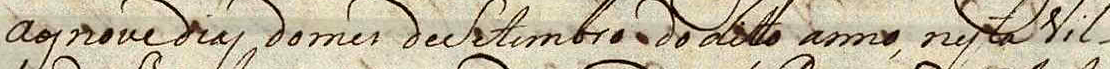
aos nove dias do mes de setembro do ditto anno, nesta Vil
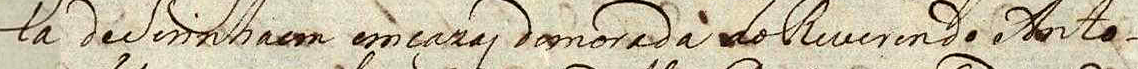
la de Serinhaem em cazas de morada do Reverendo Anto
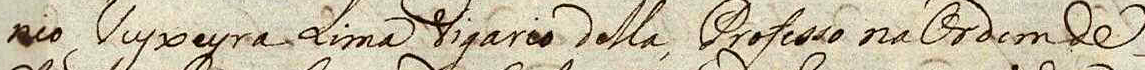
nio Teyxeyra Lima Vigario della, Professo na Ordem de
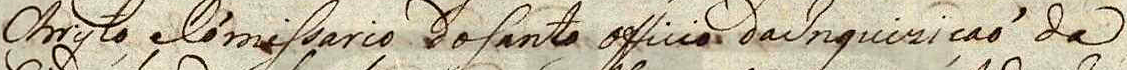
Christo e Cōmissario do Santo officio da Inquiziçaõ da
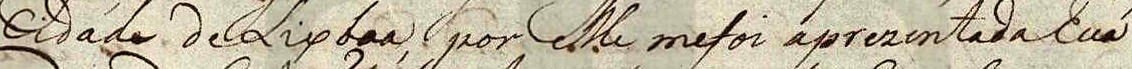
Cidade de Lixboa, por elle me foi aprezentada Huā
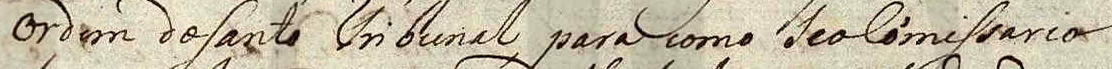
ordem do Santo Tribunal, para como Seo Cōmissario
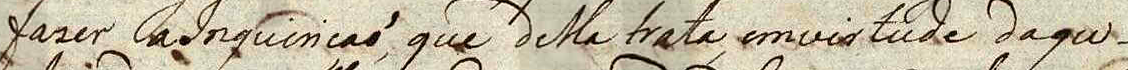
fazer a Inquisiçaõ, que della trata; em virtude da qu
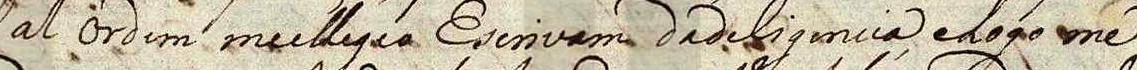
al Ordem me ellegeo Escrivam da deligencia e Logo me
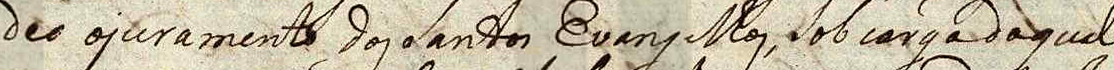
deo o juramento dos Santos Evangelhos, Sob cargo do qual
